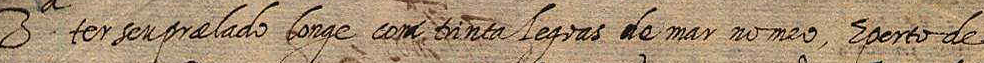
3a ter seu prælado longe com trinta legoas de mar no meo, E perto de
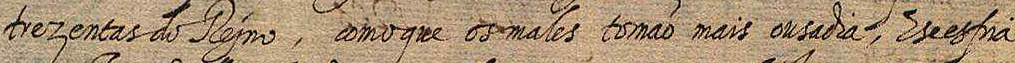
trezentas do Rejno, com o que os males tomaõ mais ousadia, E se esfria
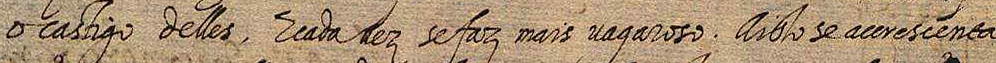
o castigo delles. E cada uez se faz mais uagaroso. A isto se accrescenta
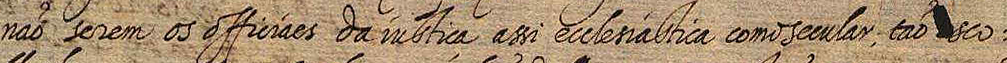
naõ serem os officiaes da iustiça assi ecclesiastica como secular, taõ _sco
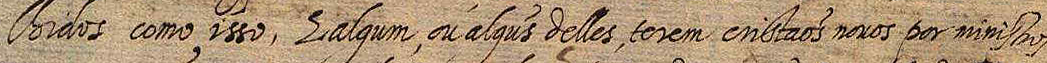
lhidos como isso, E algum, ou algūs delles, terem cristaõs nouos por ministros
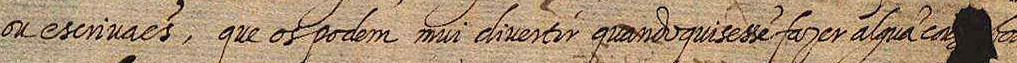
ou escriuaẽs, que os podem mui diuertir quando quisessē fazer alguā coi_ boa
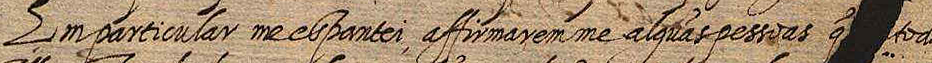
Em particular me espantei, affirmarem me alguās pessoas q̄ _ toda
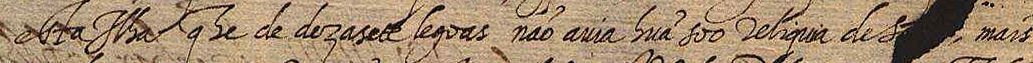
esta Jlha q̄ he de dezasete legoas naõ auia huā soo reliquia de s_, mais
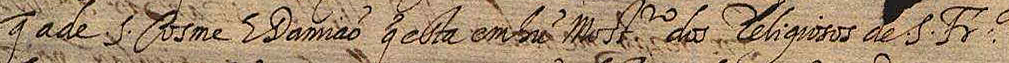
q̄ a de .S. Cosme E Damiaõ q̄ esta em hū Most.ro dos Religiosos de S. Fr.co
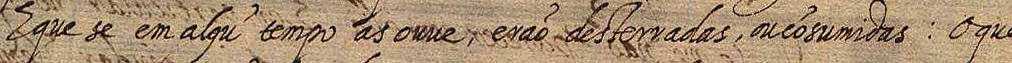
E que se em algū tempo as ouue, eraõ desterradas, ou cōsumidas: o que
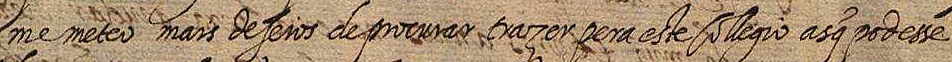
me meteo mais deseios de procurar trazer pera este Collegio as q̄ podesse.
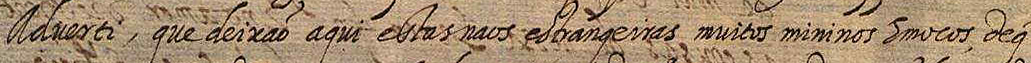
Aduerti, que deixaõ aqui estas naos estrangeiras muitos mininos E mocos, de q̄
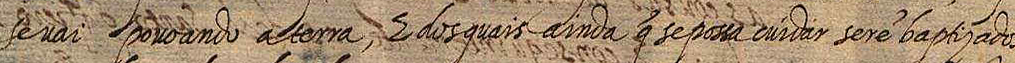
se uai pouoando a terra, E dos quais ainda q̄ se possa cuidar serē baptizados,
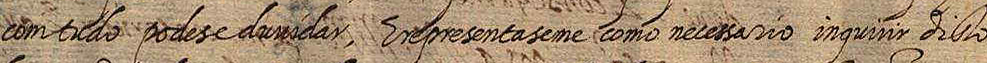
comtudo podese duuidar, E representaseme como necessario inquirir disto,
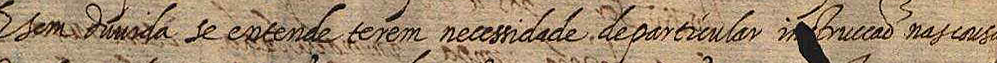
E sem duuida se entende terem necessidade de particular in_truccaõ nas cousa
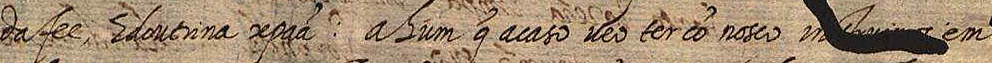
da fee, E doutrina xpaā: a hum q̄ acaso ueo ter cōnosco instrui_s em
